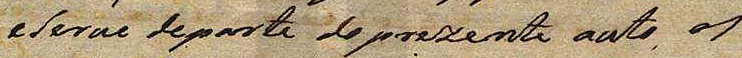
e serue de parte do prezente auto as
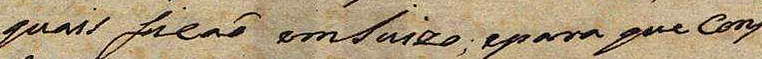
quais ficaõ em Iuizo; e para que cons
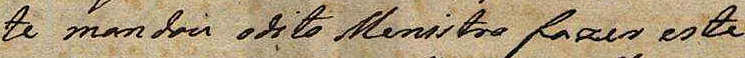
te mandou o dito Menistro fazer este
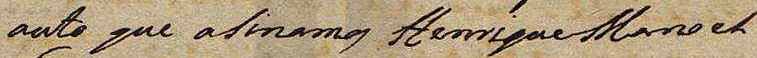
auto que asinamos Henrique Manoel
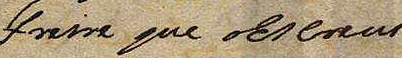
Freire que o Escreui
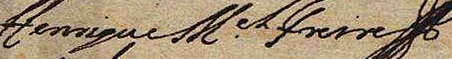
Henrique M.el Freire
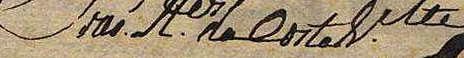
Ioaõ H.es da Costa V.lte
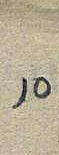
10
